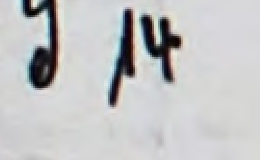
9 14
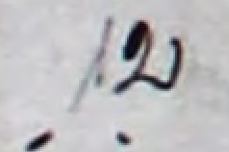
12
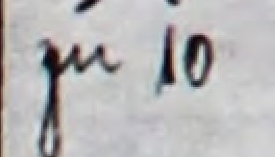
zu 10
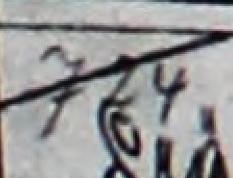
724
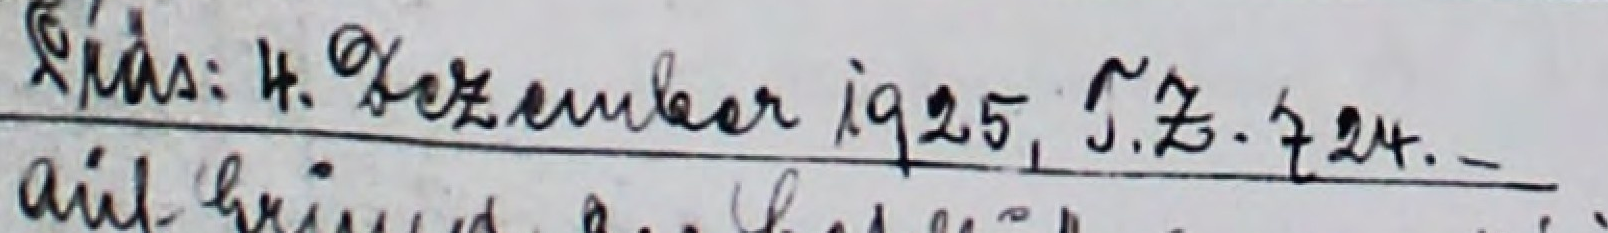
Präs: 4. Dezember 1925, T.Z. 724.-
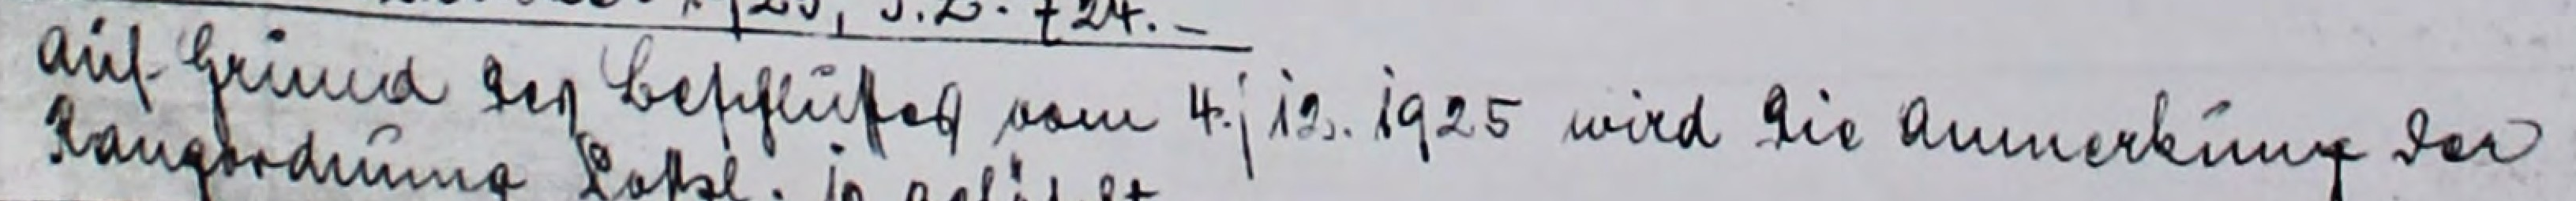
Auf Grund des Beschlusses vom 4./12. 1925 wird die Anmerkung der
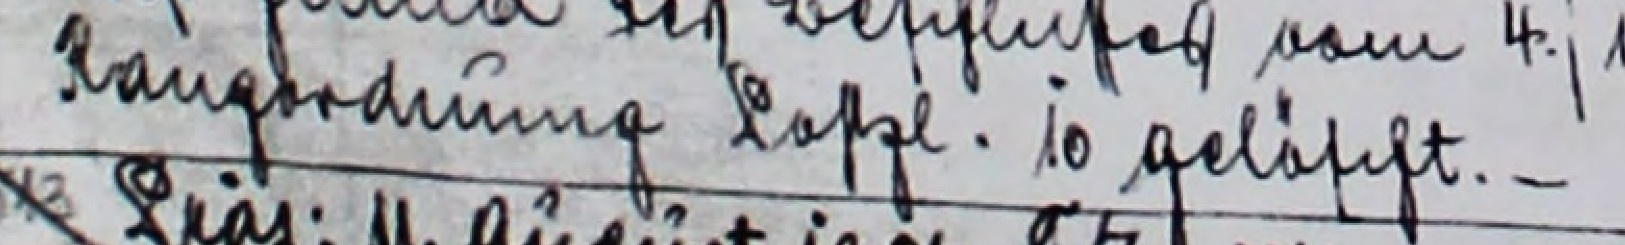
Rangordnung Postzl. 10 gelöscht.-
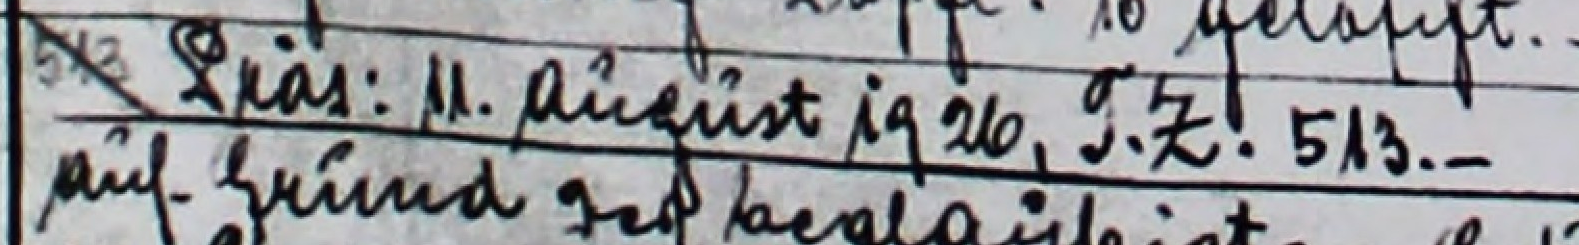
513 Präs: 11. August 1926, T.Z. 513.-
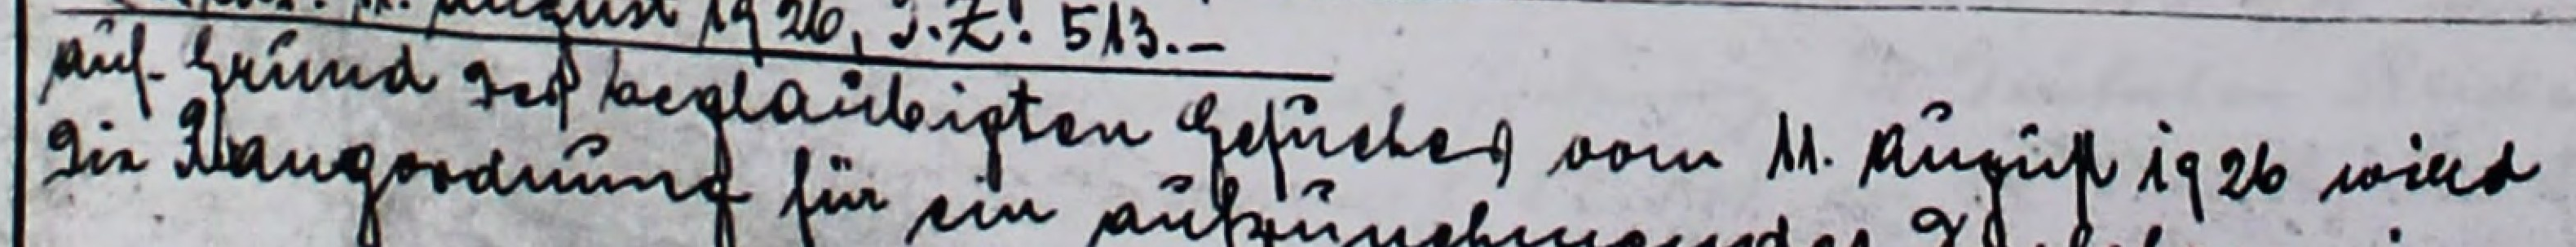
Auf Grund des beglaubigten Gesuches vom 11. August 1926 wird
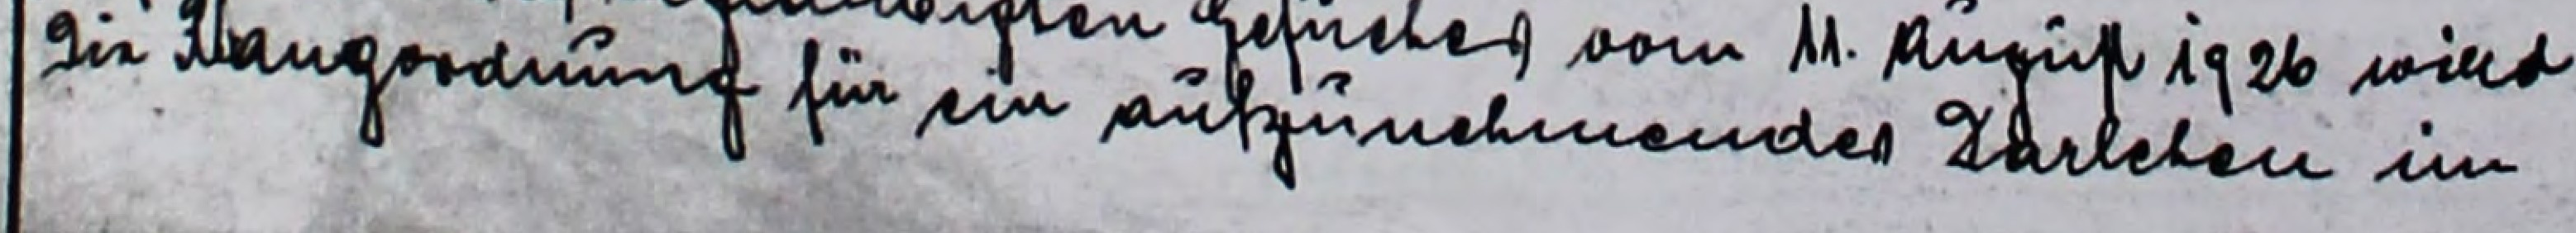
die Rangordnung für ein aufzunehmendes Darlehen im
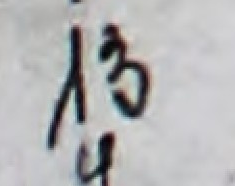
13
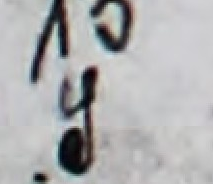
S
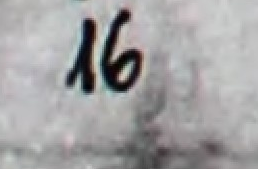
16
